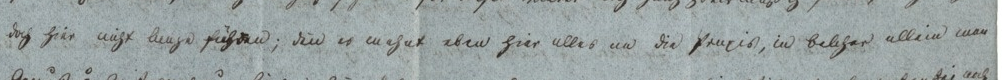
doch hier nicht lange führen; denn es mahnt eben hier alles an die Praxis, in welcher allein man
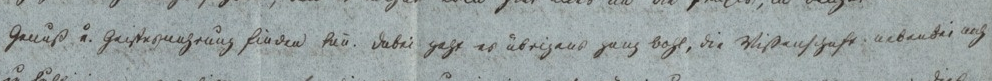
Genuß u. Geistesnahrung finden kann. Dabei geht es übrigens ganz wohl, die Wissenschaft nebenbei noch
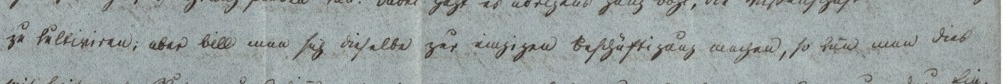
zu kultiviren; aber will man sich dieselbe zur einzigen Beschäftigung machen, so kann man dies
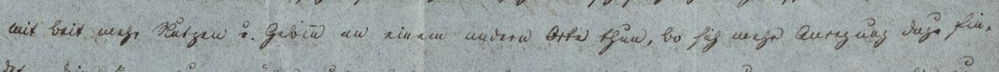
mit weit mehr Nutzen u. Gewinn an einem andern Orte thun, wo sich mehr Anregung dazu fin-
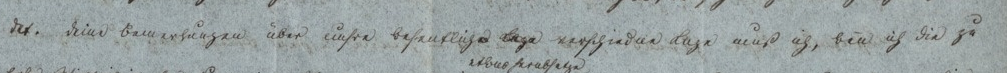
det. Deine Bemerkungen über unsre wesentliche Lage verschiedne Lage muß ich, wenn ich die zu
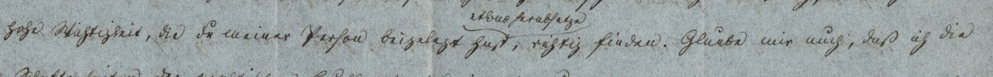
hohe Wichtigkeit, die Du meiner Person beigelegt hast etwas herabsetze, richtig finden. Glaube mir auch, daß ich die
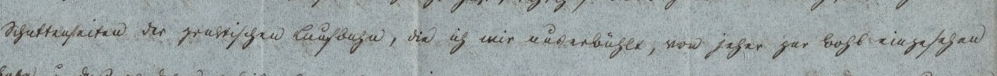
Schattenseiten der praktischen Laufbahn, die ich mir auserwählt, von jeher gar wohl eingesehen
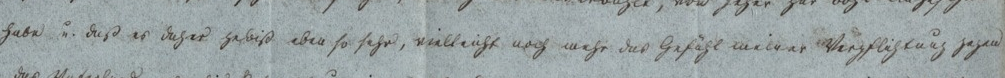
habe u. daß es daher gewiß eben so sehr, vielleicht noch mehr das Gefühl meiner Verpflichtung gegen
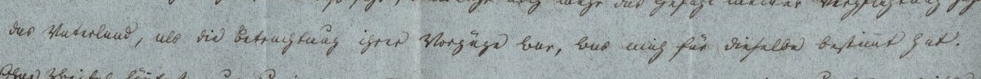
das Vaterland, als die Betrachtung ihrer Vorzüge war, was mich für dieselbe bestimmt hat.
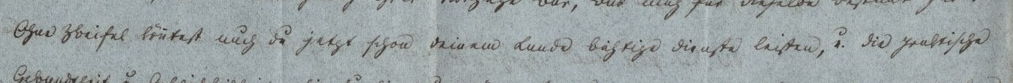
Ohne Zweifel könntest auch Du jetzt schon Deinem Lande wichtige Dienste leisten, u. die praktische
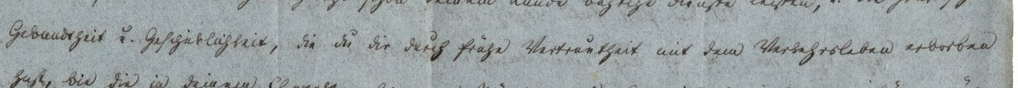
Gewandtheit u. Geschicklichkeit, die Du Dir durch frühe Vertrautheit mit dem Verkehrsleben erworben
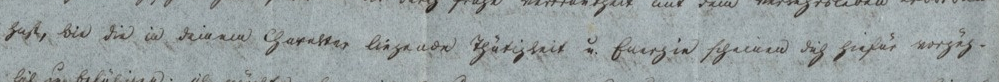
hast, wie die in Deinem Charakter liegende Thätigkeit u. Energie scheinen Dich hiefür vorzüg-
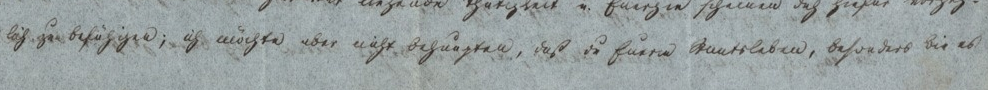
lich zu befähigen; ich möchte aber nicht behaupten, daß Du Euerm Staatsleben, besonders wie es
